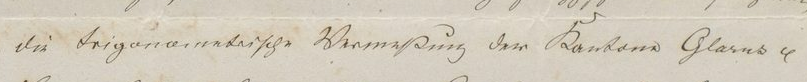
die trigonometrische Vermeßung der Kantone Glarus &
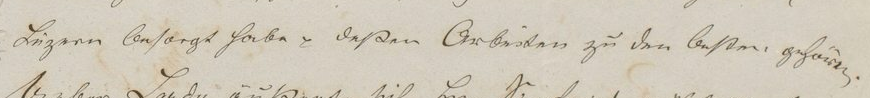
Luzern besorgt habe & deßen Arbeiten zu den besten gehören.
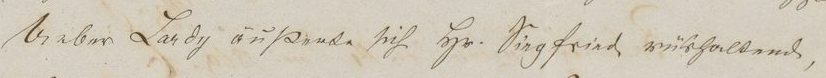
Ueber Lardy äußerte sich Hr. Siegfried rükhaltend,
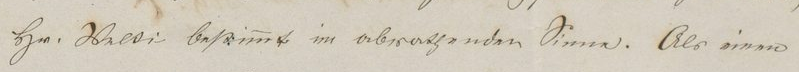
Hr. Welti bestimmt im abrathenden Sinne. Als einen
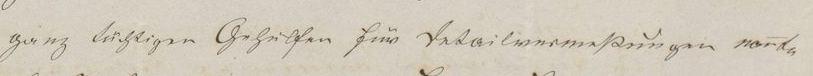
ganz tüchtigen Gehülfen für Detailvermeßungen nannte
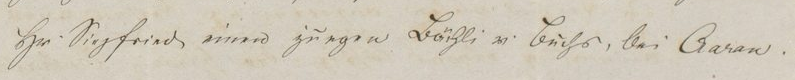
Hr. Siegfried einen jungen Bächli v. Buchs, bei Aarau. –
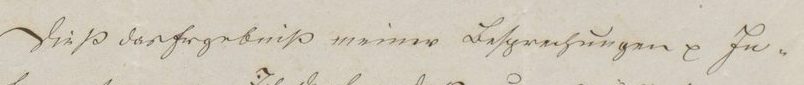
Dieß das Ergebniß meiner Besprechungen & In-
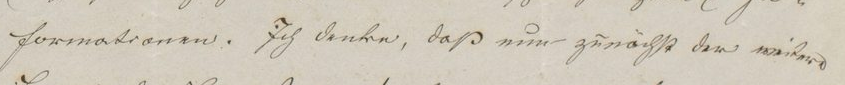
formationen. Ich denke, daß nun zunächst der weitere
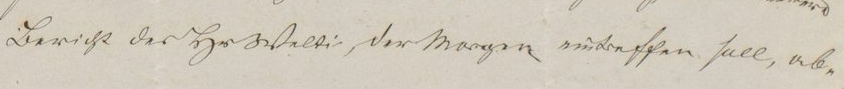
Bericht des. Hrn Welti, der Morgen eintreffen soll, ab-
